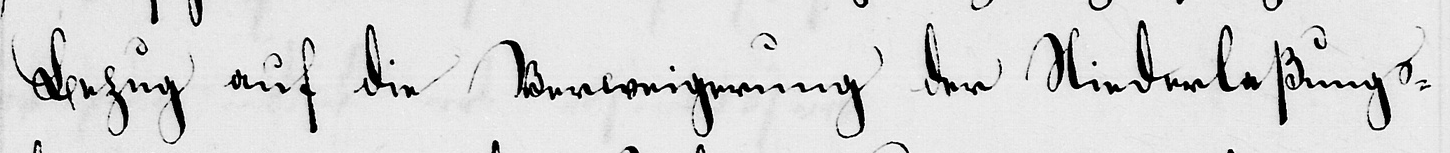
Bezug auf die Verweigerung der Niederlaßungs¬
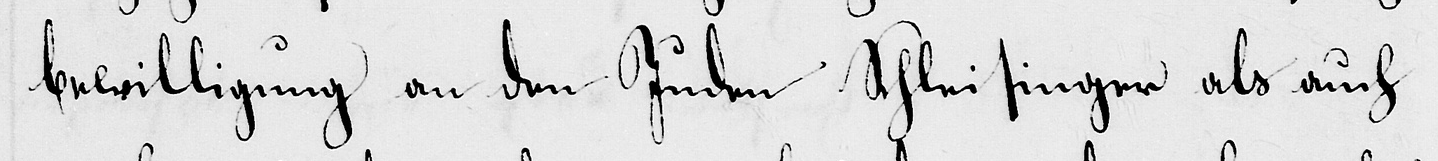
bewilligung an den Juden Schleisinger als auch
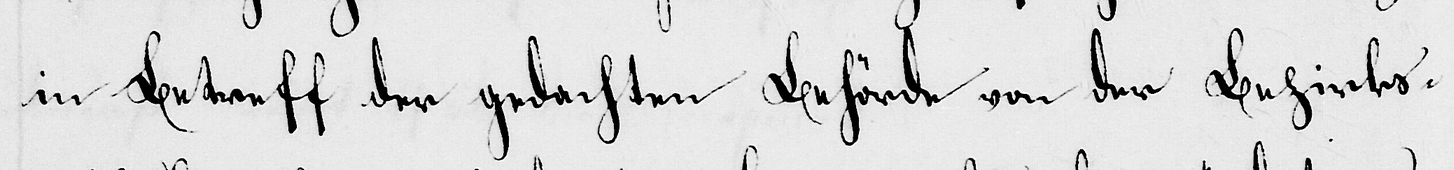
in Betreff der gedachten Behörde von der Bezirks¬
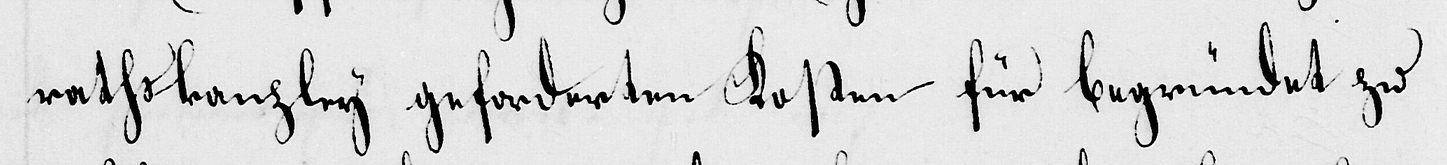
rathskanzley geforderten Kosten für begründet zu
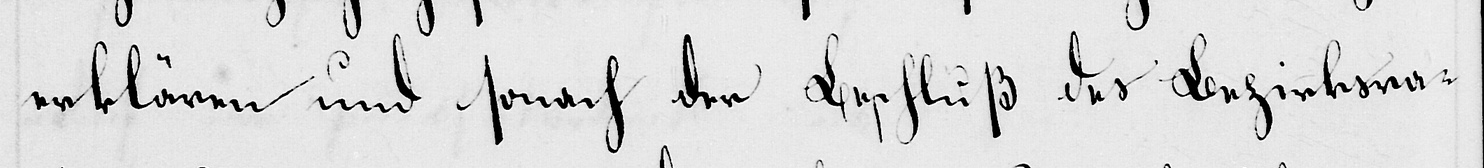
erklären und sonach der Beschluß des Bezirksra¬
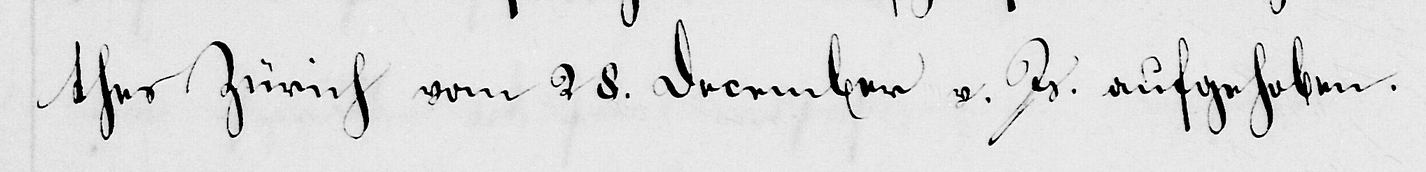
thes Zürich vom 28. December v. Js. aufgehoben.
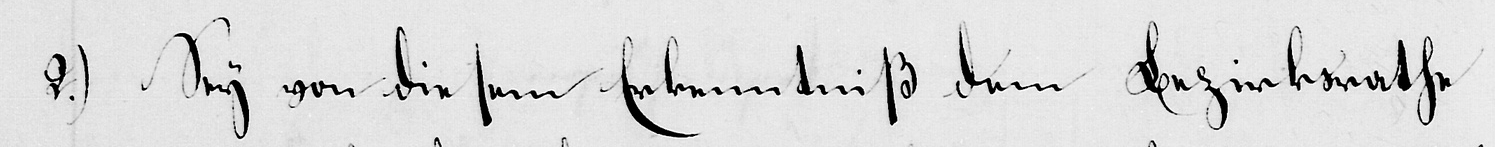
2.) Sey von diesem Erkenntniß dem Bezirksrathe
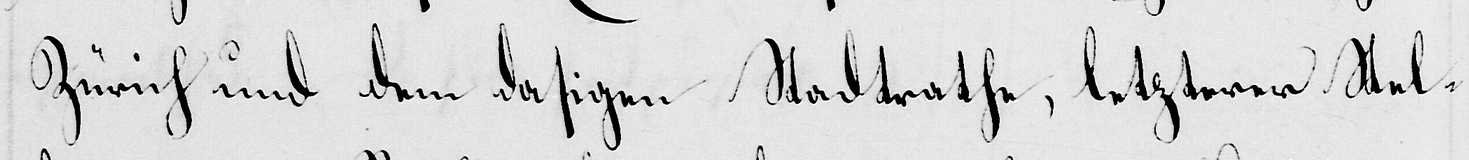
Zürich und dem dasigen Stadtrathe, letzterer Stel¬
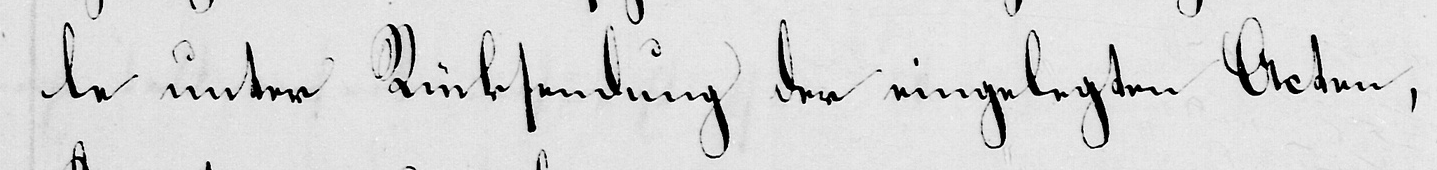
le unter Rücksendung der eingelegten Acten,
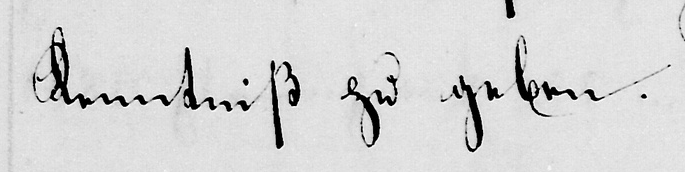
Kenntniß zu geben.
